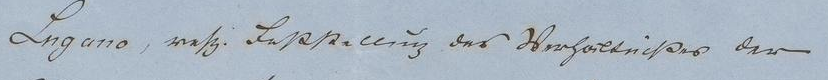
Lugano, resp. Feststellung des Verhältnißes der
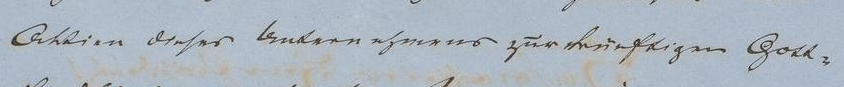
Aktien dieses Unternehmens zur künftigen Gott-
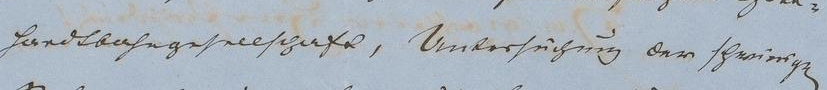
hardtbahngesellschaft, Untersuchung der schwierigen
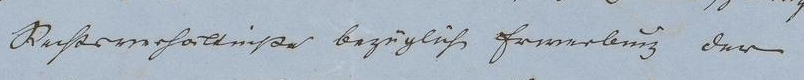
Rechtsverhältniße bezüglich Erwerbung der
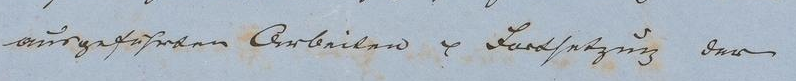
ausgeführten Arbeiten & Fortsetzung der
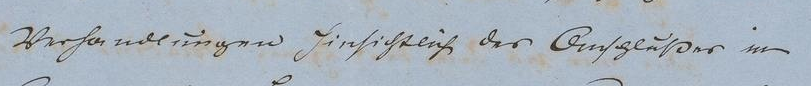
Verhandlungen hinsichtlich des Anschlußes in
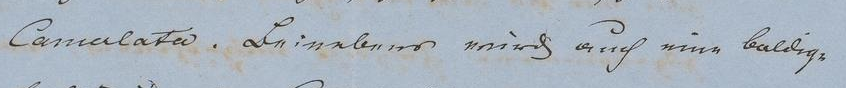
Camerlata. Beinebens wird auch eine baldige
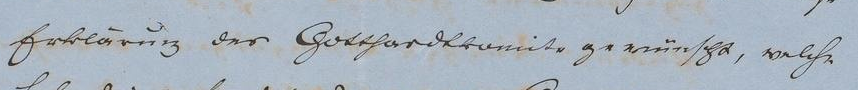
Erklärung des Gotthardtkomite gewünscht, welche
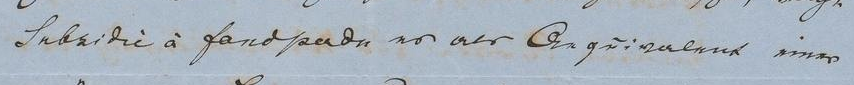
Subsidie à fond perdu es als Aequivalent einer
